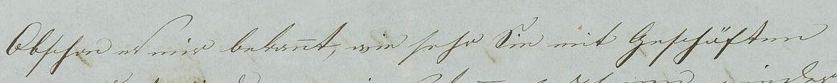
Obschon es mir bekannt, wie sehr Sie mit Geschäften
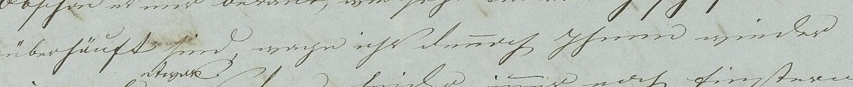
überhäuft sind, wage ichs dennoch Ihnen wieder
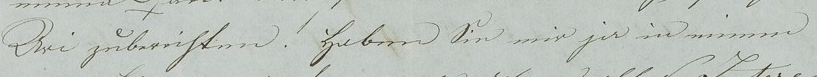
Uri zuberichten! Haben Sie mir ja in einem
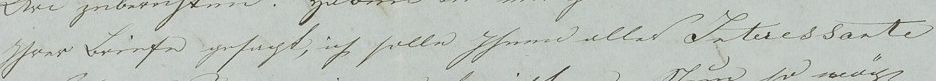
Ihrer Briefe gesagt, ich solle Ihnen alles Interessante
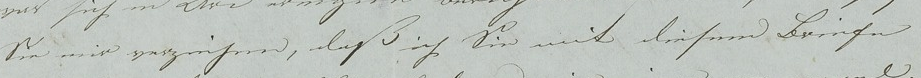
Sie mir verzeihen, daß ich Sie mit diesem Briefe
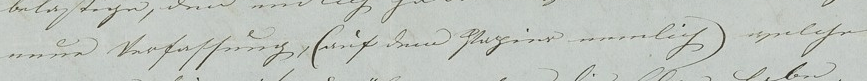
neue Verfassung, (auf dem Papier nemlich ) welche
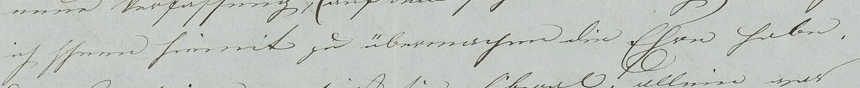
ich Ihnen hiemit zu übermachen die Ehre habe.
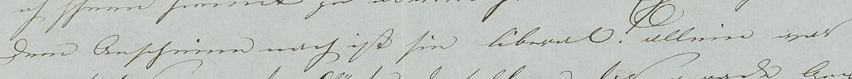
Dem Anscheine nach ist sie liberal! allein was
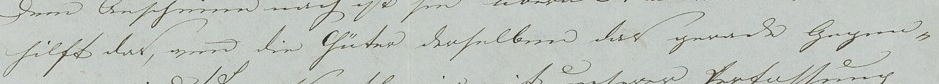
hilft das, wenn die Hüter derselben das gerade Gegen-
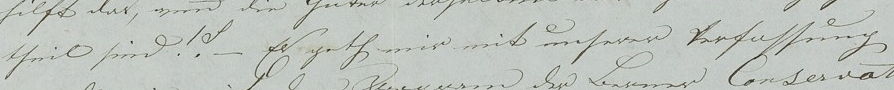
theil sind!? – Es geth mir mit unserer Verfassung
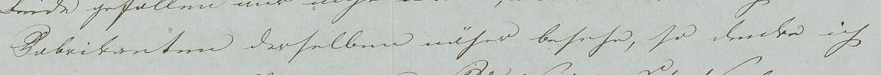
Fabrikanten derselben näher besehe, so denke ich
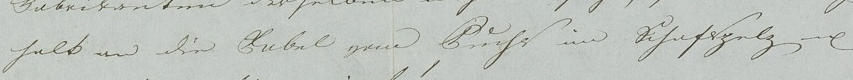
halt an die Fabel vom Fuchs im Schafspelz &
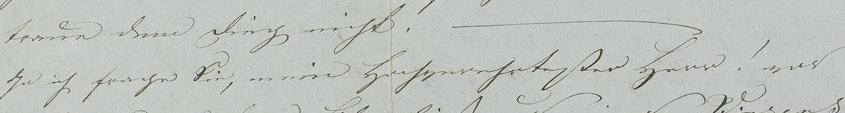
Ja ich frage Sie, mein Hochverehrtester Herr! was
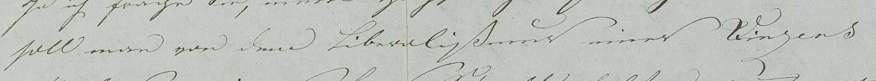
soll man von dem Liberalißmus eines Vinzens
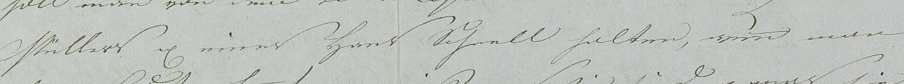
Müllers & eines Hans Schnell halten, wenn man
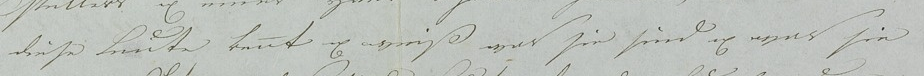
diese Leute kennt & weiß was sie sind & was sie
